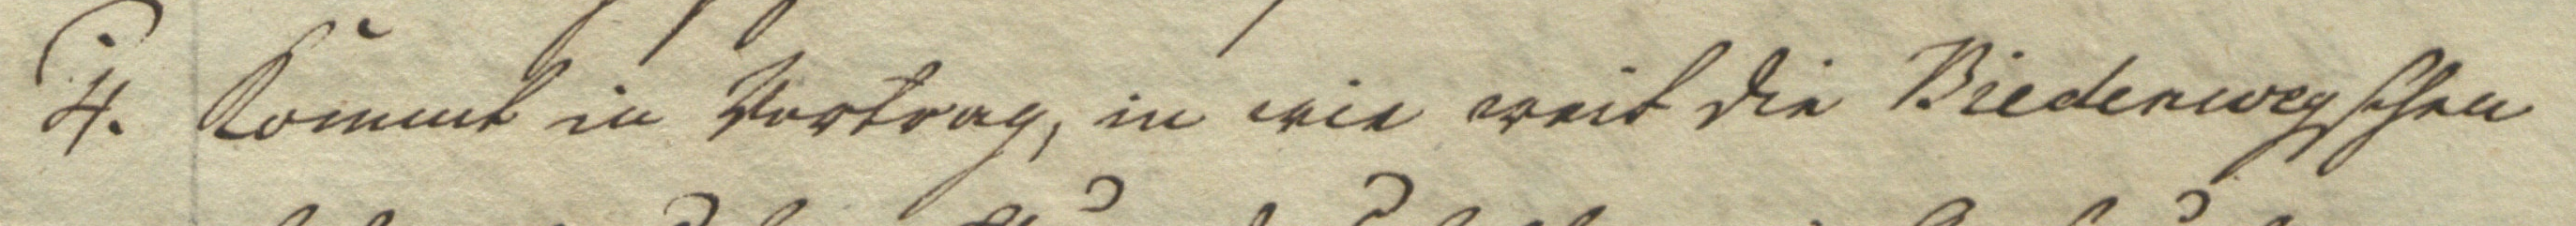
4. Kommt in Vortrag, in wie weit die Biedenwegschen
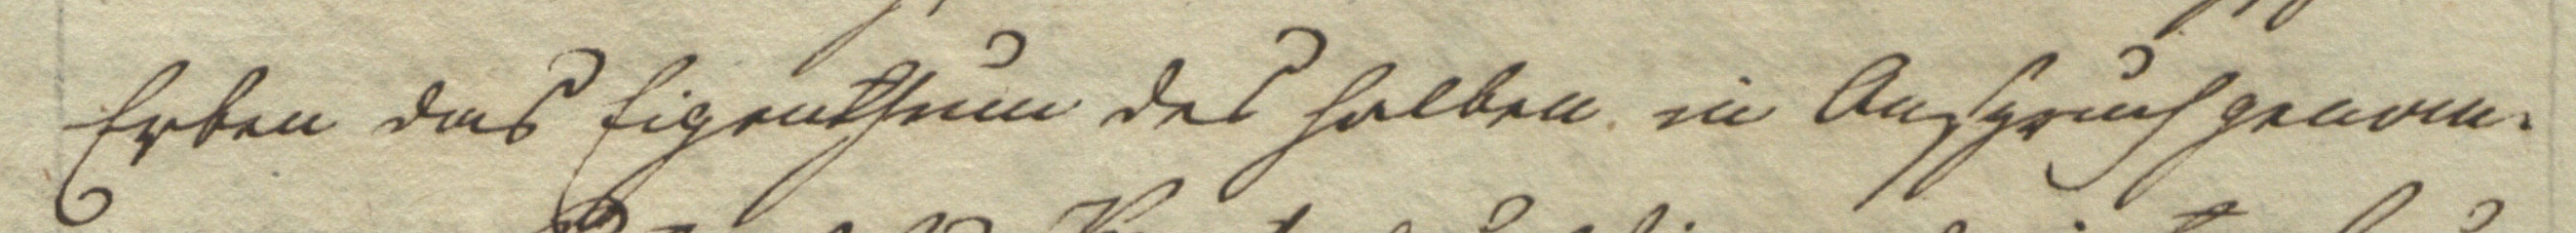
Erben das Eigenthum des halben in Anspruch genom¬
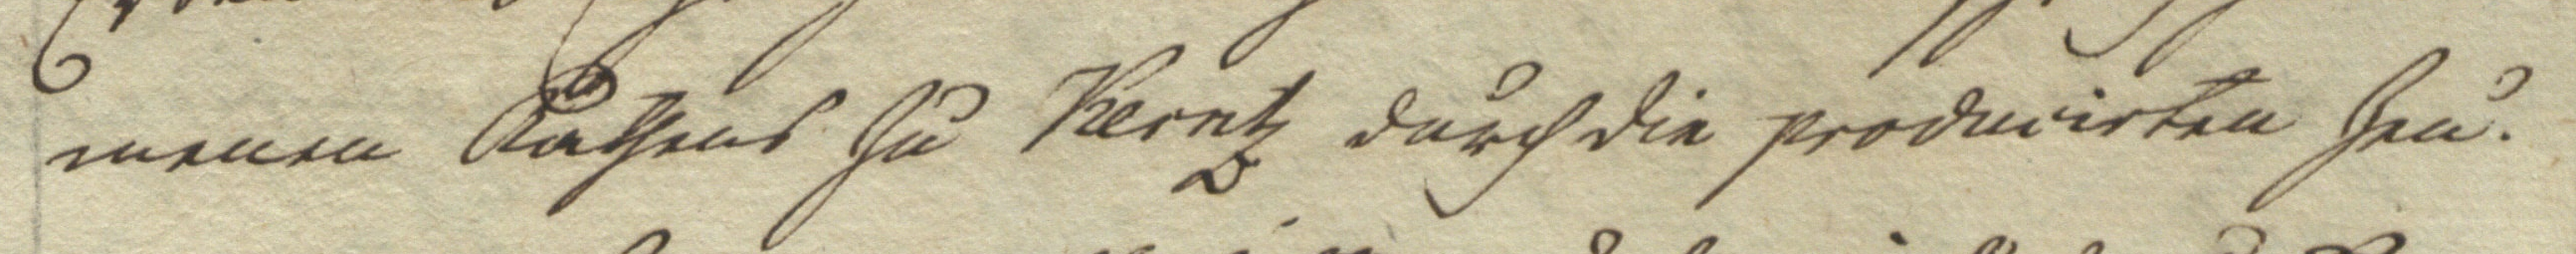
menen Kathens zu Kemtz durch die producirten Zeu¬
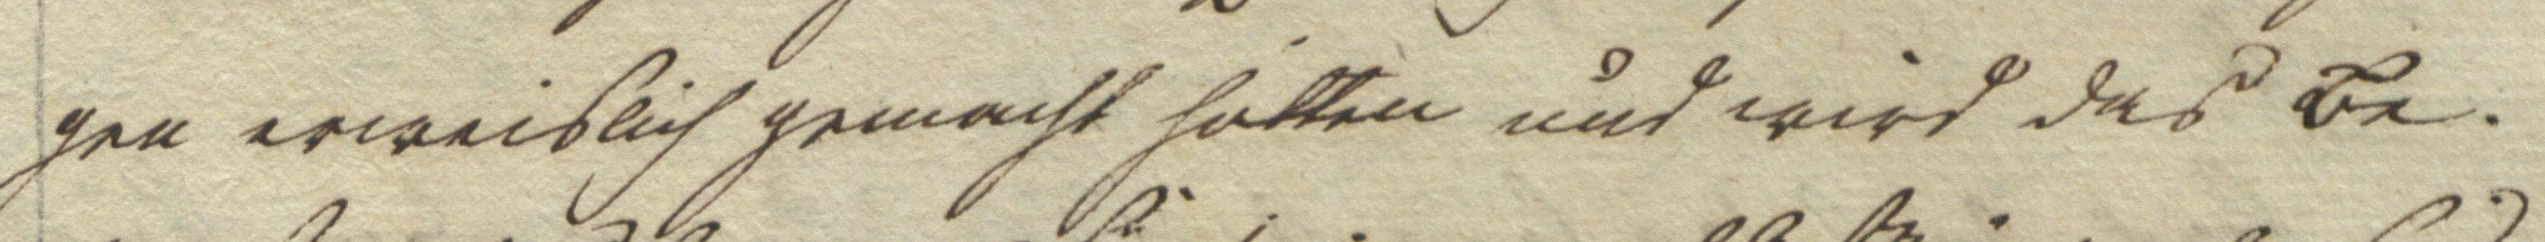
gen erweislich gemacht hätten und wird das Be¬
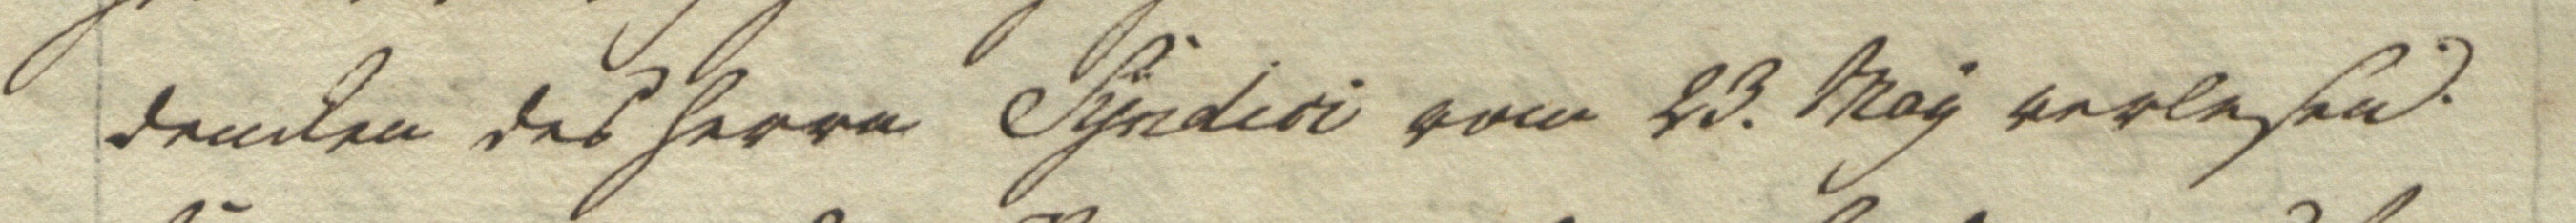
denken des Herrn Syndici vom 23. May verlesen.
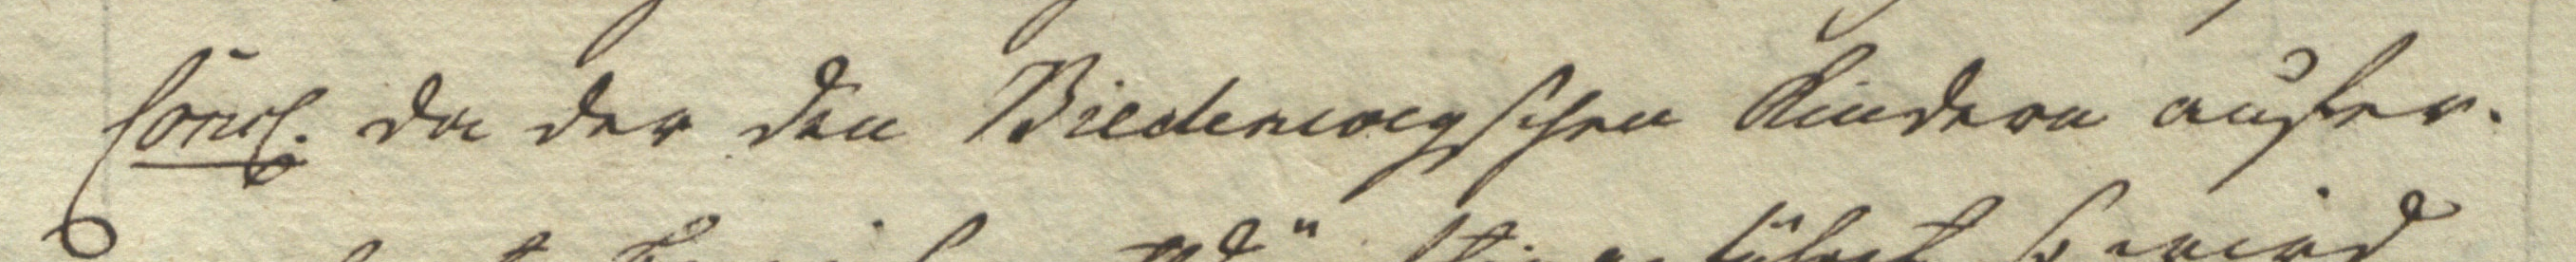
Concl. Da der den Biedenwegschen Kindern aufer¬
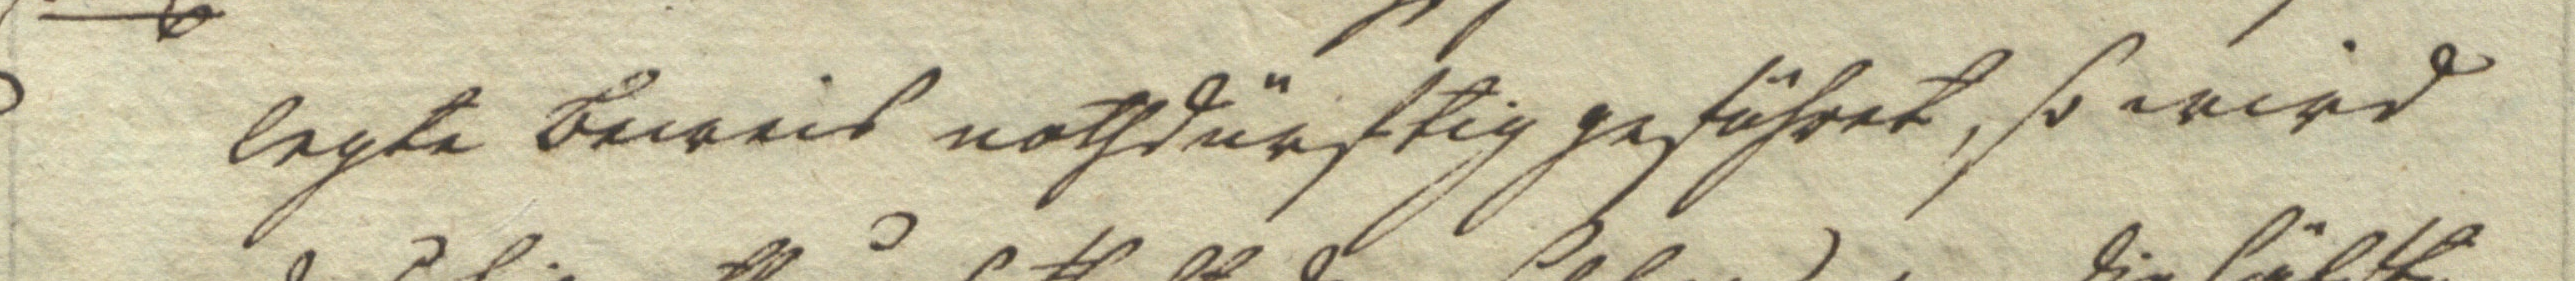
legte Beweis nothdürftig geführet, so wird
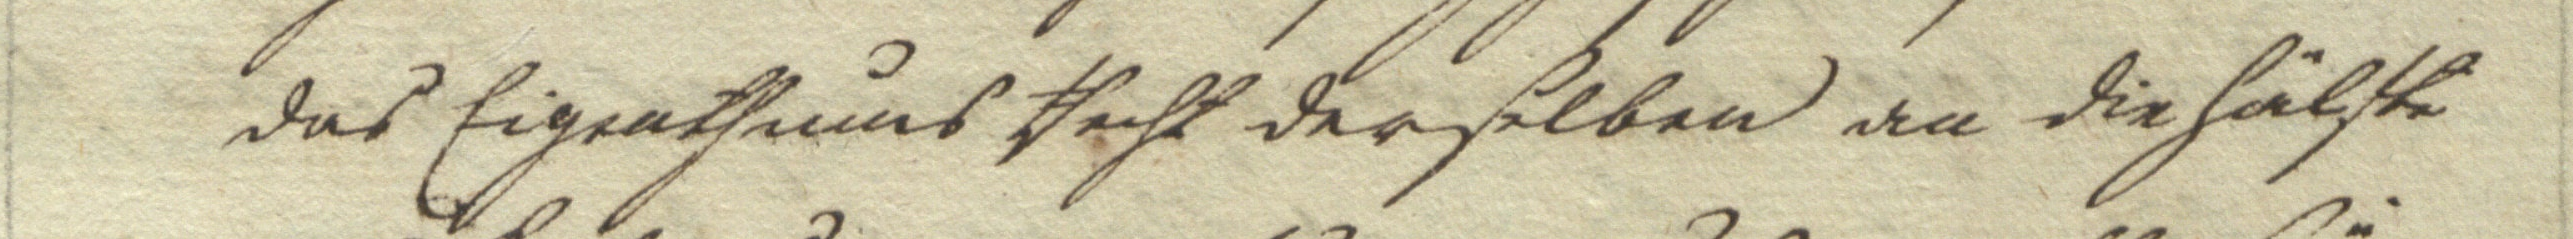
das Eigenthums Recht derselben an die Hälfte
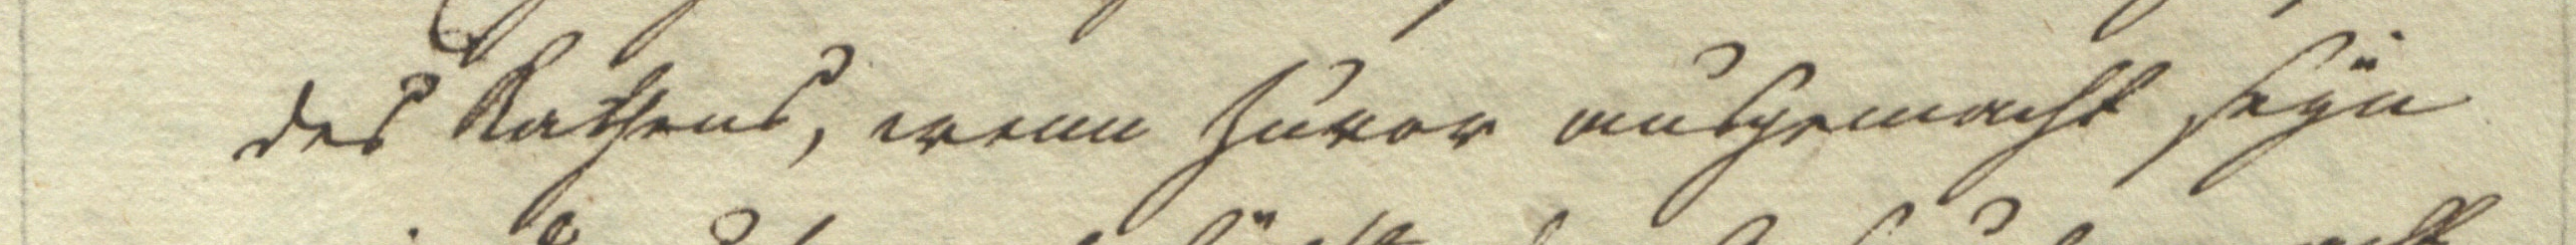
des Kathens, wenn zuvor ausgemacht seyn
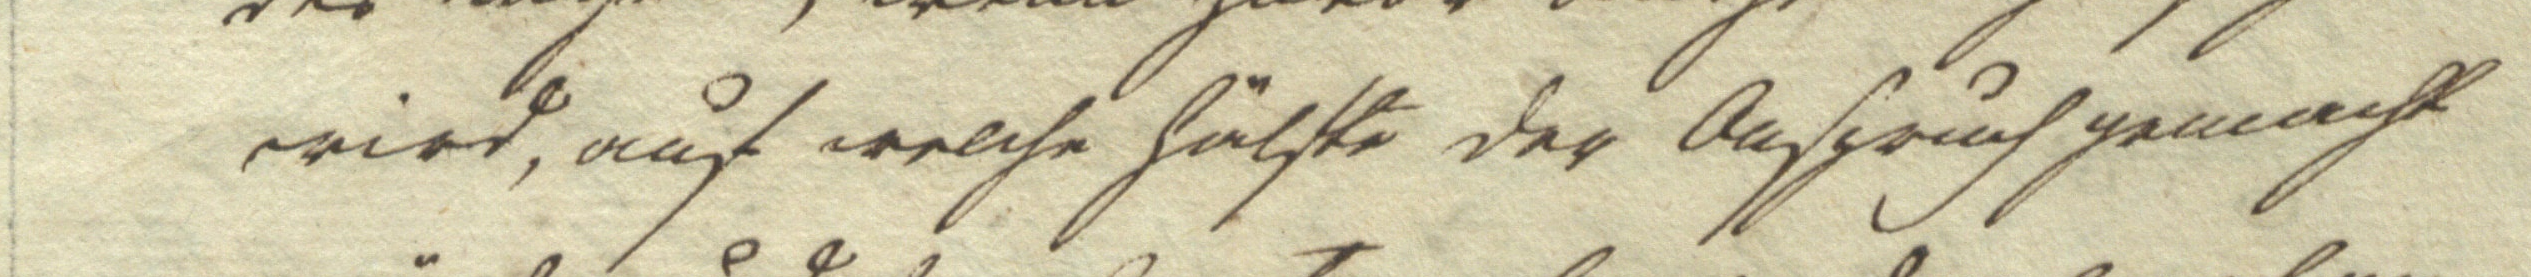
wird, auf welche Hälfte der Anspruch gemacht
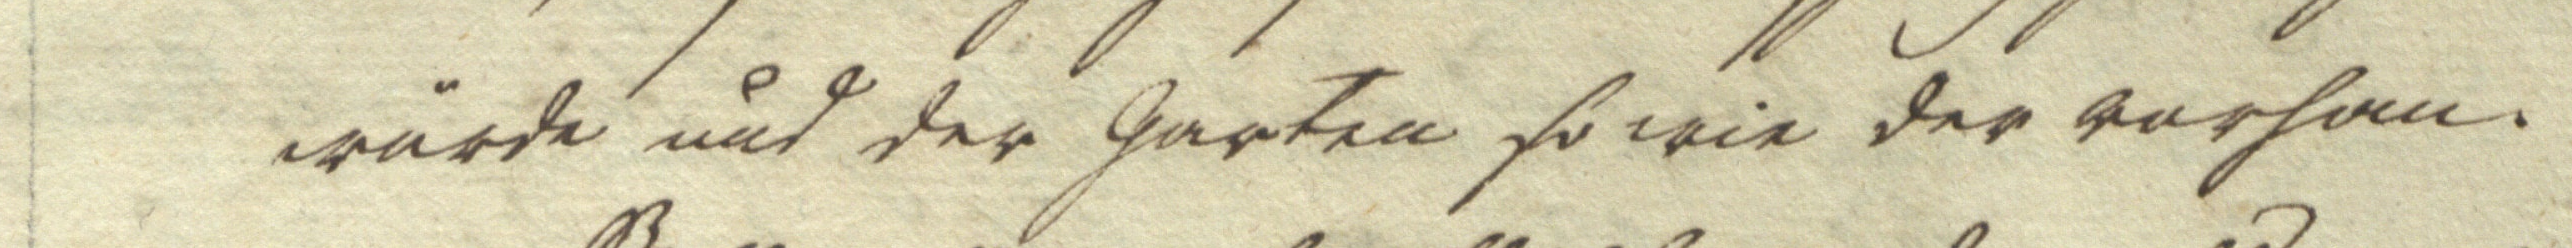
würde und der Garten so wie der vorhan¬
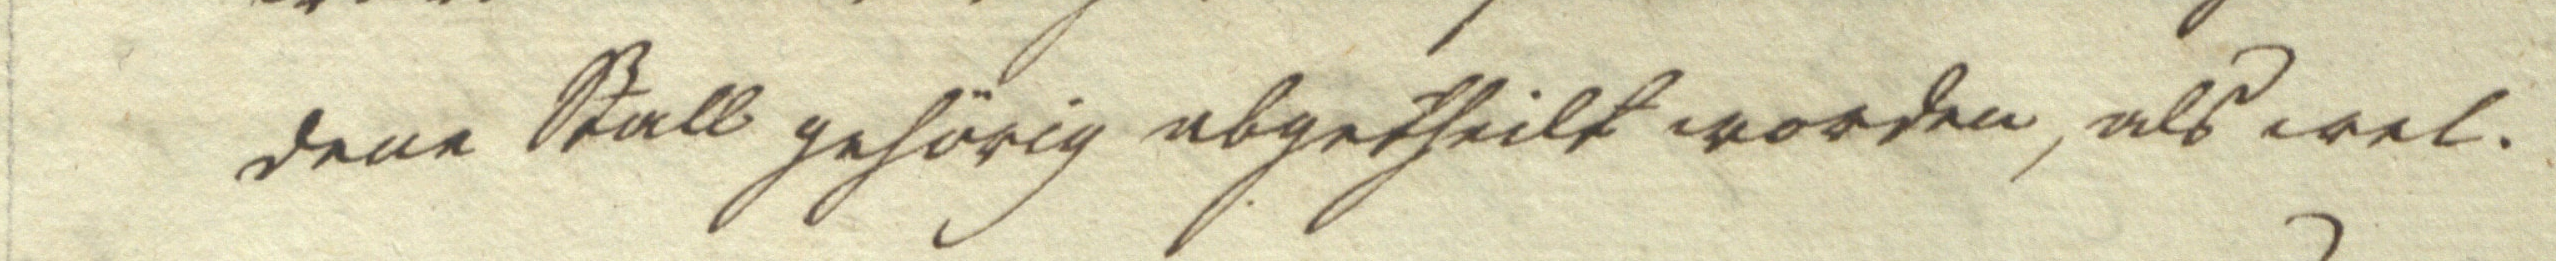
dene Stall gehörig abgetheilt worden, als wel¬
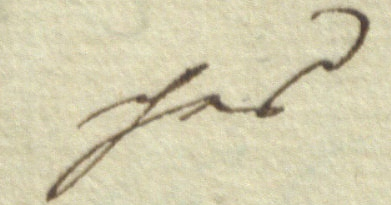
ches
